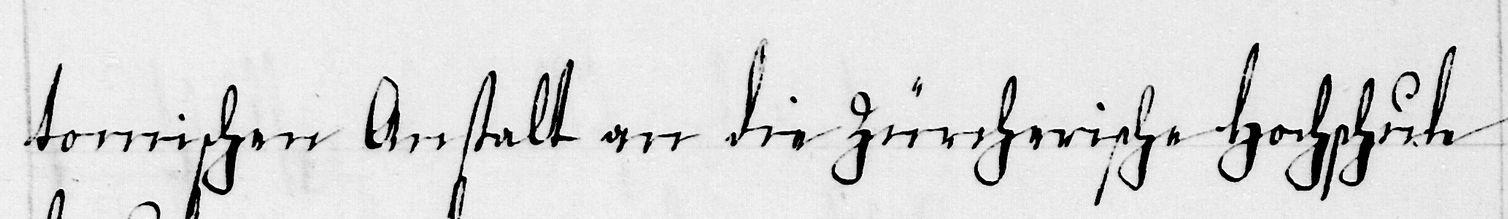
tomischen Anstalt an die Zürcherische Hochschule
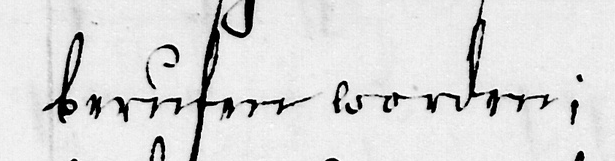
berufen worden;
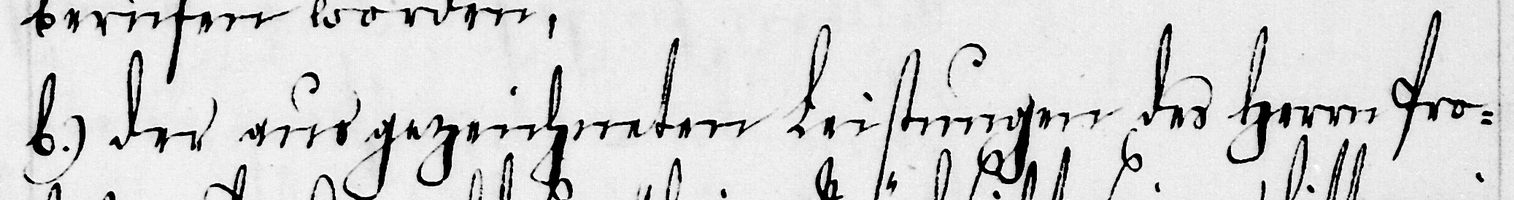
b.) der ausgezeichneten Leistungen des Herrn Pro¬
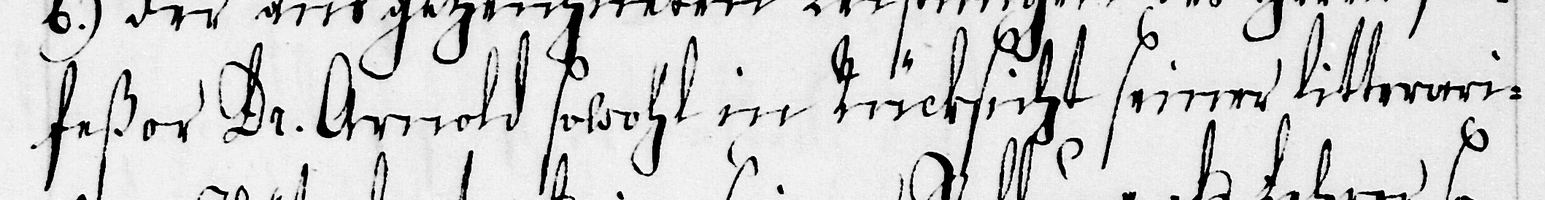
feßor Dr. Arnold sowohl in Rücksicht seiner litterari¬
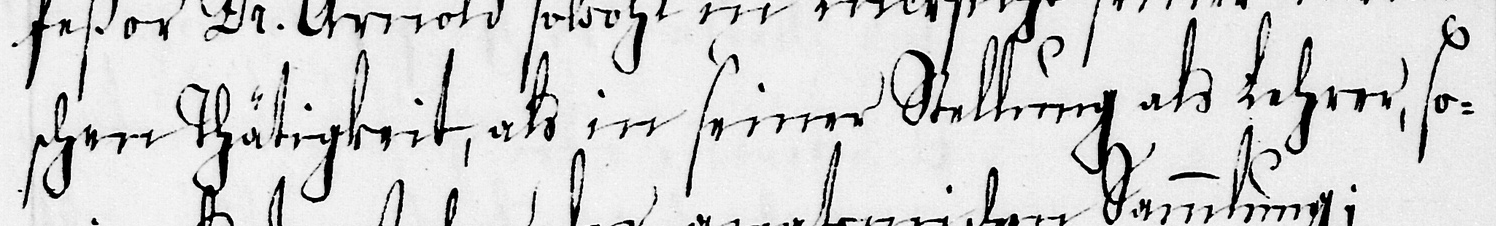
schen Thätigkeit, als in seiner Stellung als Lehrer, so¬
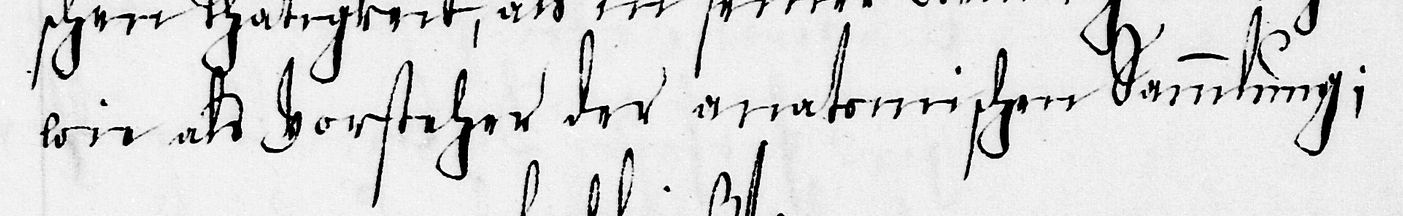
wie als Vorsteher der anatomischen Sammlung;
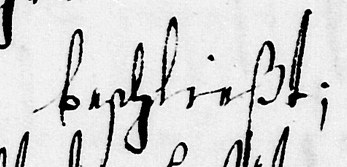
beschließt;
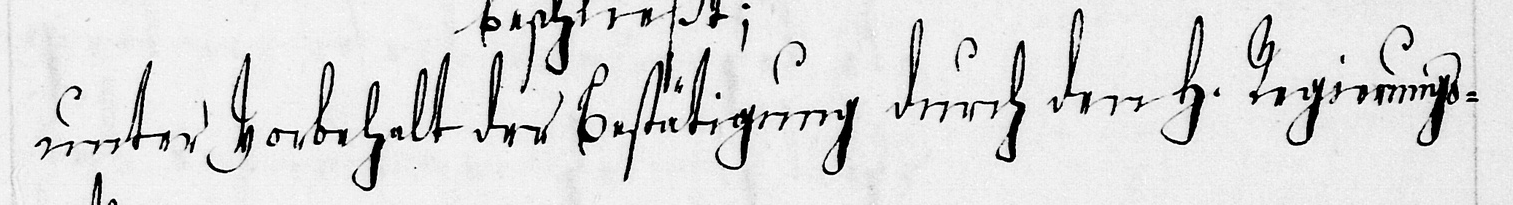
unter Vorbehalt der Bestätigung durch den H. Regierungs¬
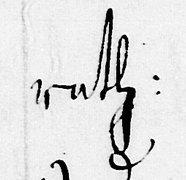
rath:
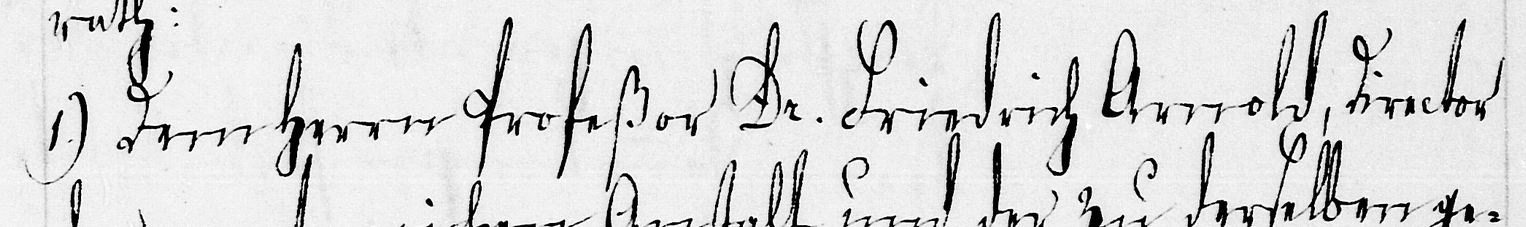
1.) Dem Herrn Profeßor Dr. Friedrich Arnold, Direc¬
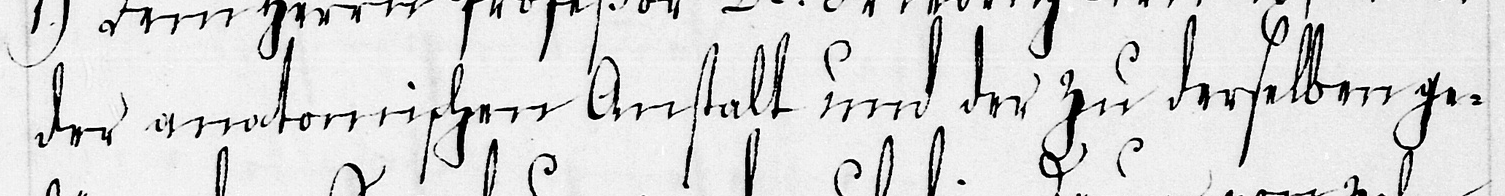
der anatomischen Anstalt und der zu derselben ge¬
